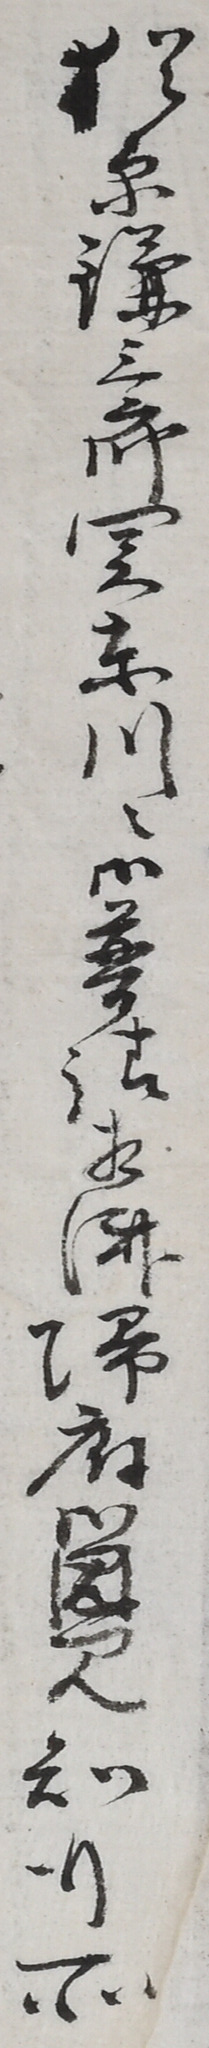松原鎌三郎関東川々御普請相済帰府御目見知行所
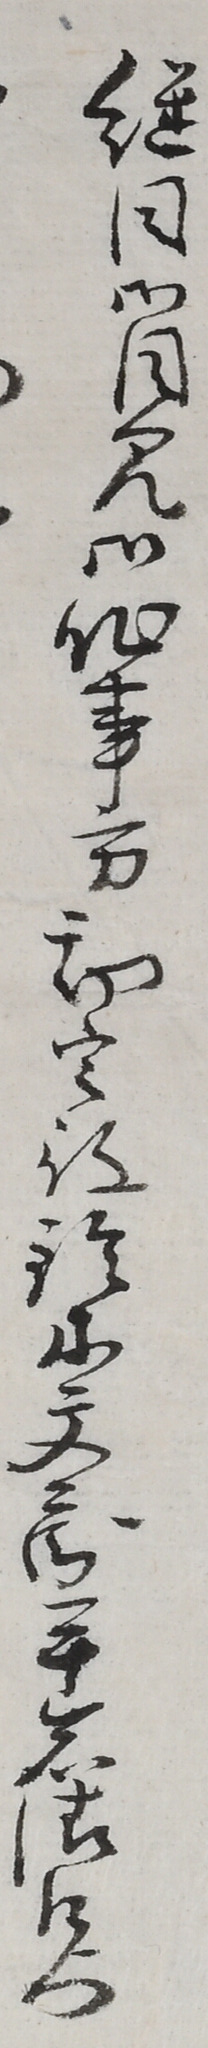継目御目見御作事方勘定役鈴木文蔵平岩清左衛門
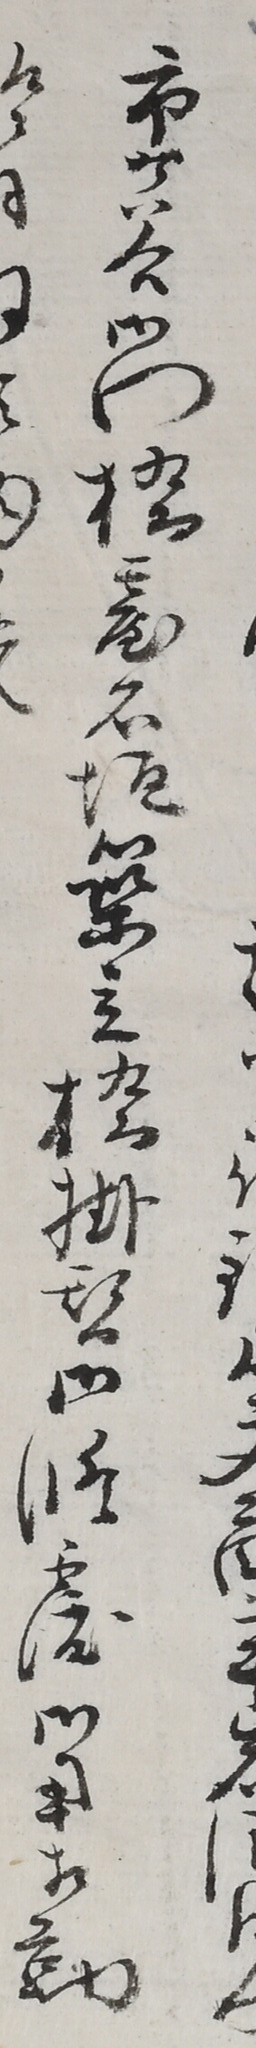市ヶ谷御門橋台石垣築立橋掛替御修覆御用相勤
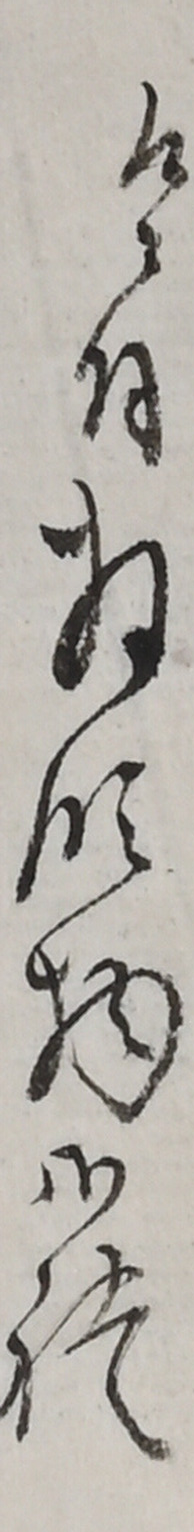候ニ付拝領御礼
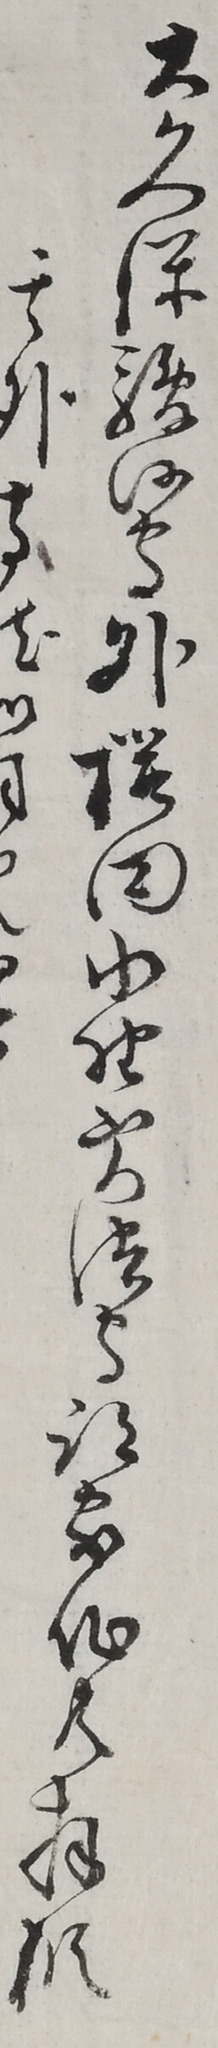大久保駿河守外桜田小野美濃守跡家作共拝領
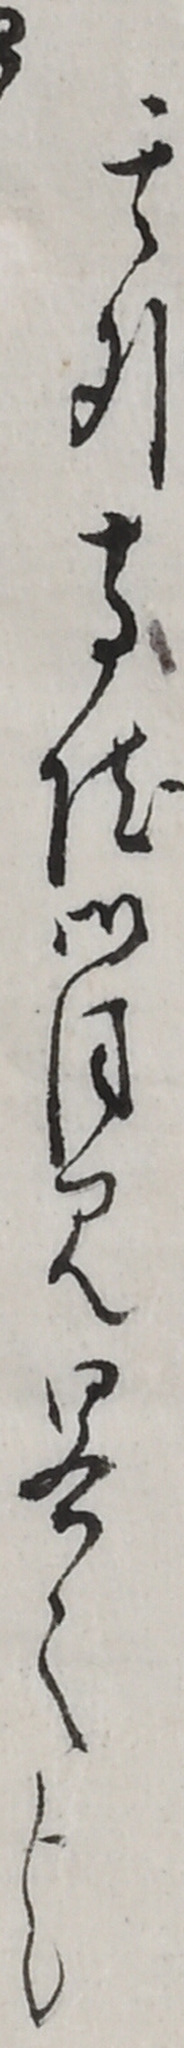其外寺院御目見略之申候
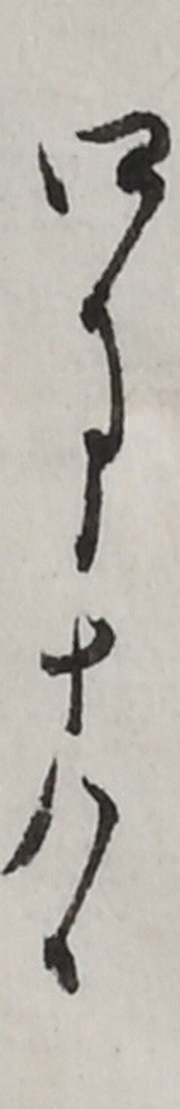四月十八日
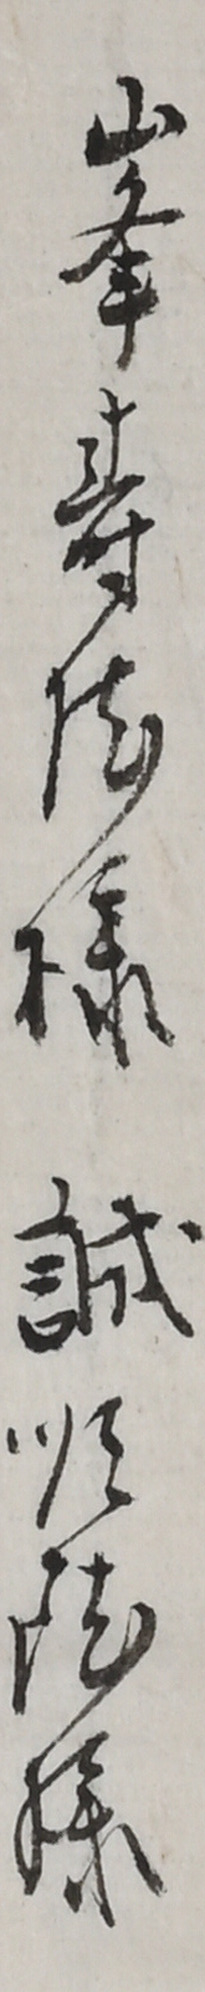峯寿院様誠順院様
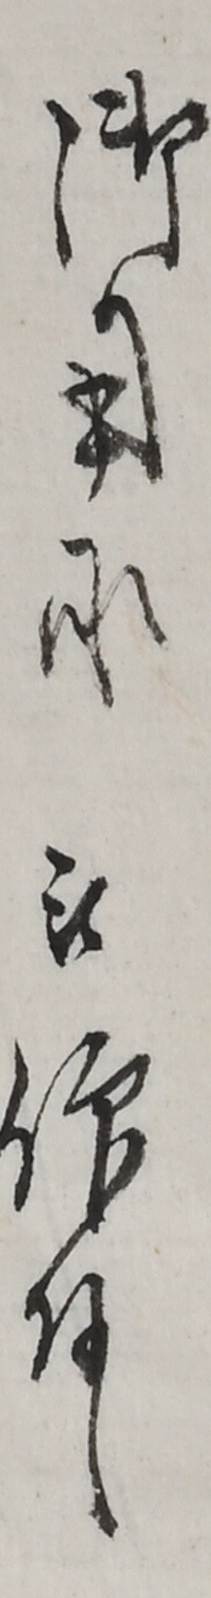御用承被仰付候
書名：申渡候書付
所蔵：伊那市立高遠町図書館・合同会社AMANE
